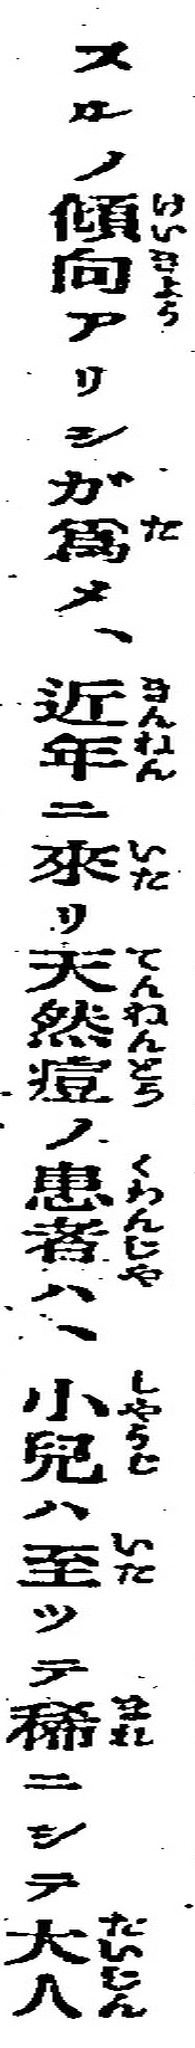スルノ傾向アリシガ為メ、近年ニ来リ天然痘ノ患者ハ、小児ハ至ツテ稀ニシテ大人

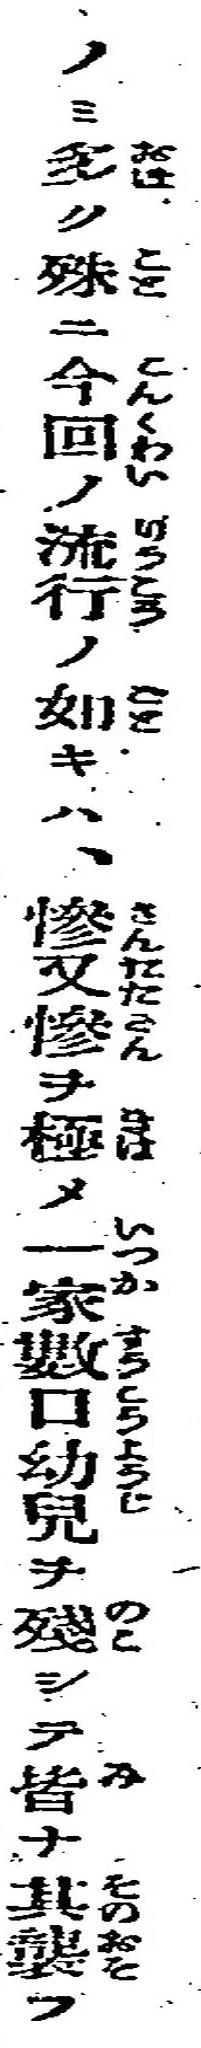ノミ多ク殊ニ今回ノ流行ノ如キハ、惨又惨ヲ極メ一家数口幼児ヲ残シテ皆ナ其襲フ
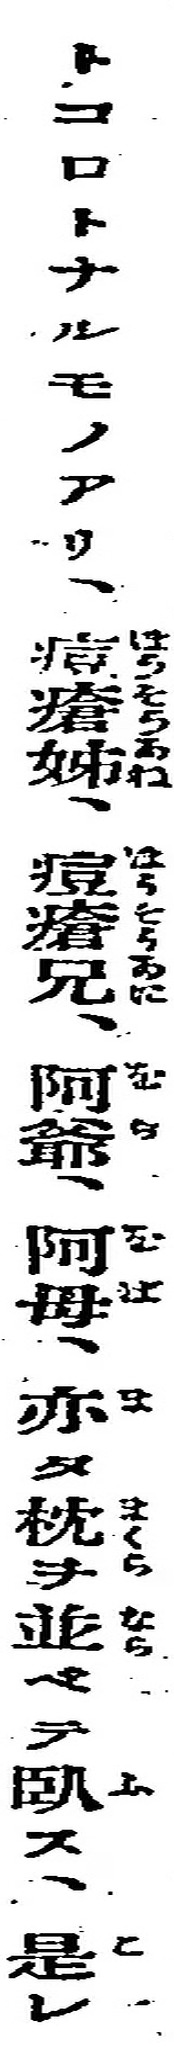トコロトナルモノアリ、痘瘡姉、痘瘡兄、阿爺、阿母、亦タ枕ヲ並ベテ臥ス、是レ
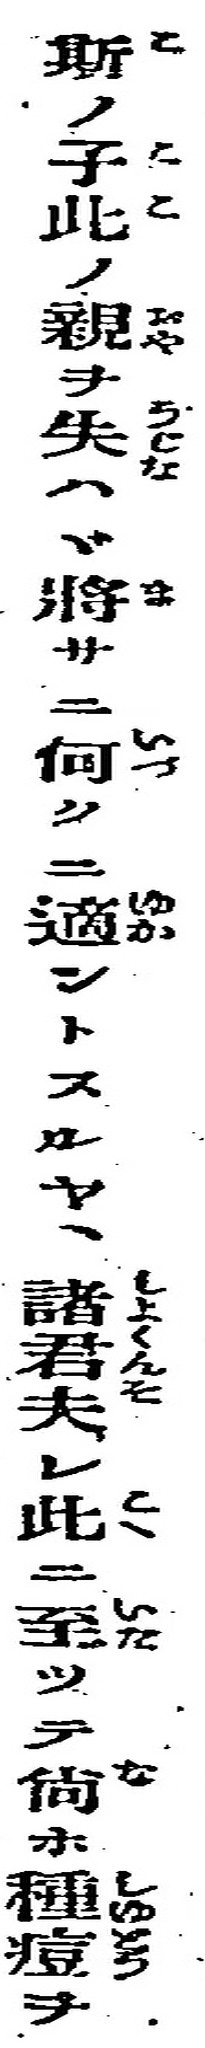斯ノ子此ノ親ヲ失ハヾ将サニ何クニ適ントスルヤ、諸君夫レ此ニ至ツテ尚ホ種痘ヲ
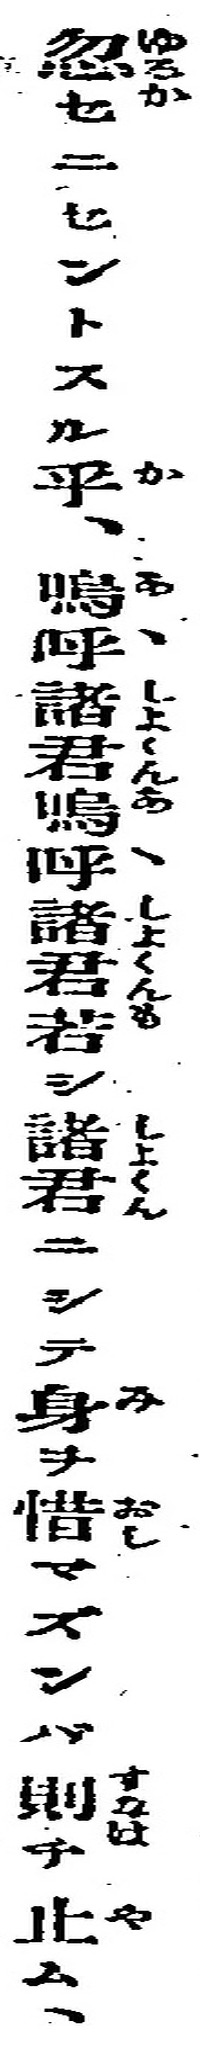忽セニセントスル乎、嗚呼諸君嗚呼諸君若シ諸君ニシテ身ヲ惜マズンバ則チ止ム、
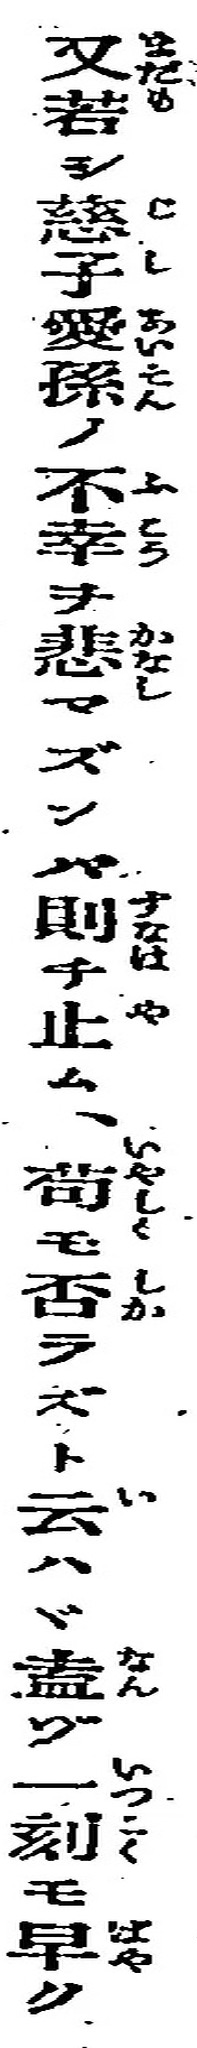又若シ慈子愛孫ノ不幸ヲ悲マズンバ則チ止ム、苟モ否ラズト云ハヾ盍ゾ一刻モ早ク
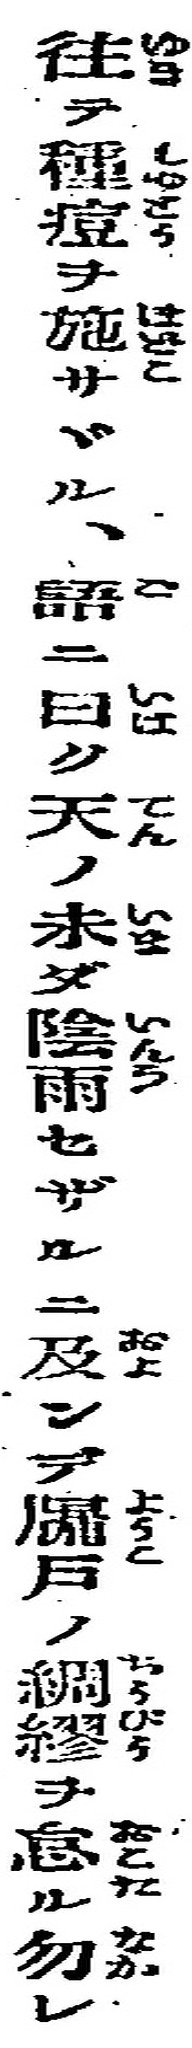往テ種痘ヲ施サヾル、語ニ曰ク天ノ未ダ陰雨セザルニ及ンデ牖戸ノ綢繆ヲ怠ル勿レ
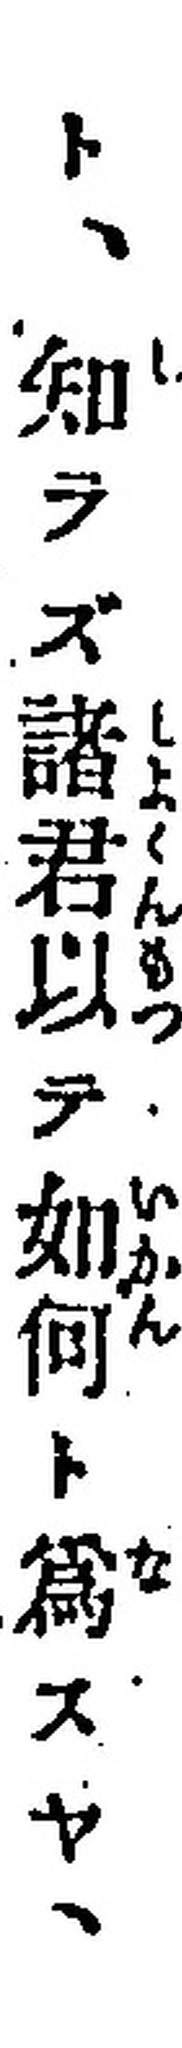ト、知ラズ諸君以テ如何ト為スヤ、
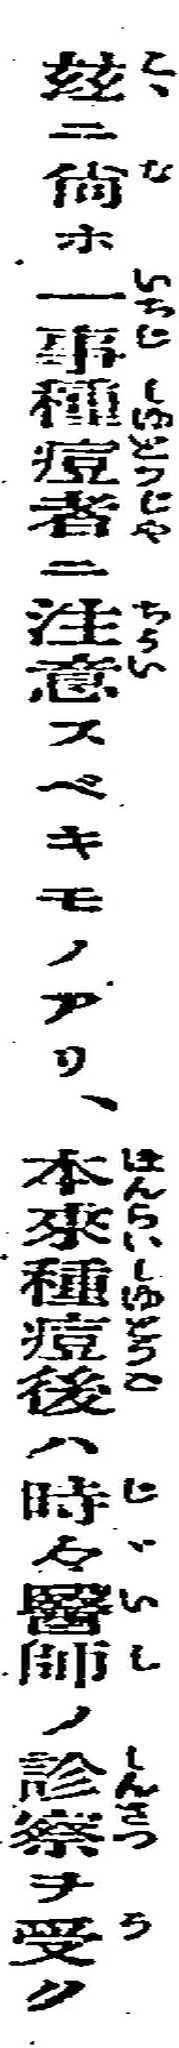茲ニ尚ホ一事種痘者ニ注意スベキモノアリ、本来種痘後ハ時々医師ノ診察ヲ受ク
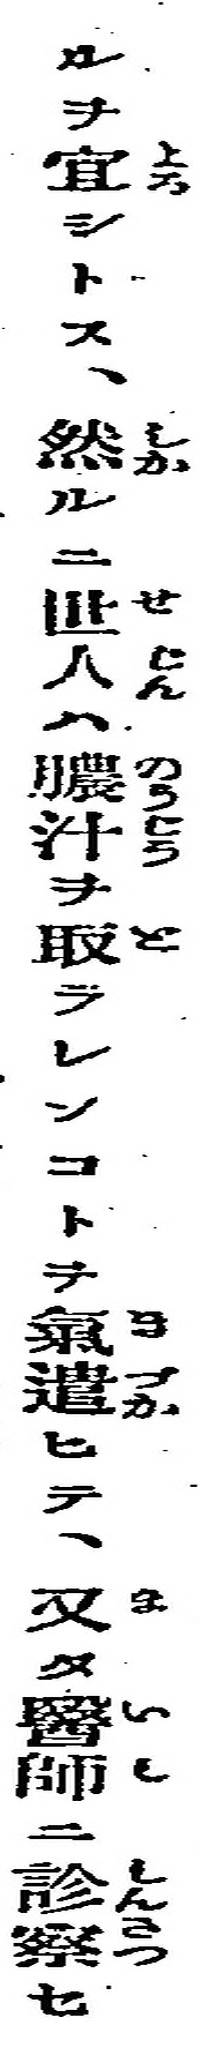ルヲ宜シトス、然ルニ世人ハ膿汁ヲ取ラレンコトヲ気遣ヒテ、又タ医師ニ診察セ
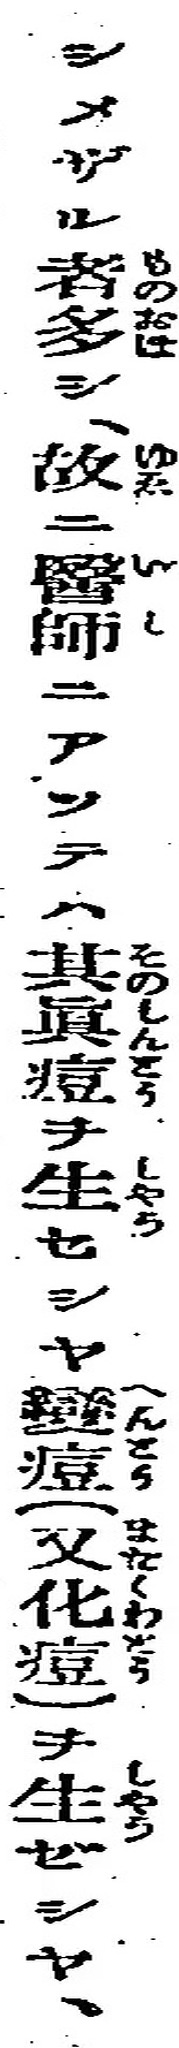シメザル者多シ、故ニ医師ニアツテハ其真痘ヲ生セシヤ変痘(又化痘)ヲ生ゼシヤ、
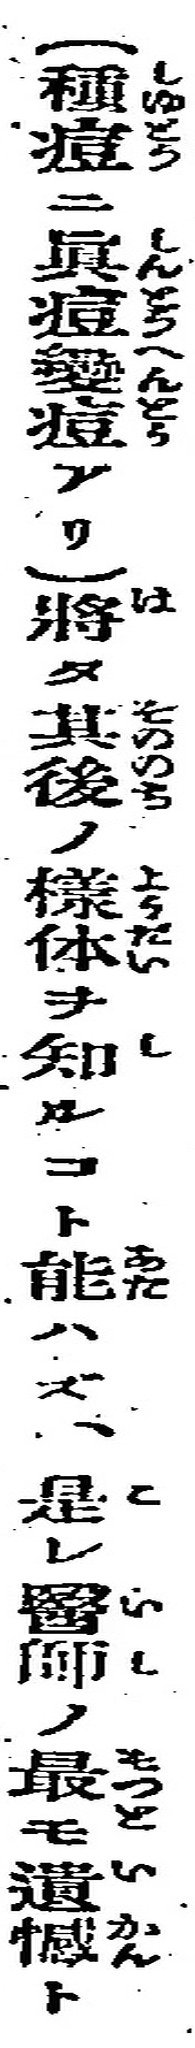(種痘ニ真痘変痘アリ)将タ其後ノ様体ヲ知ルコト能ハズ、是レ医師ノ最モ遺憾ト
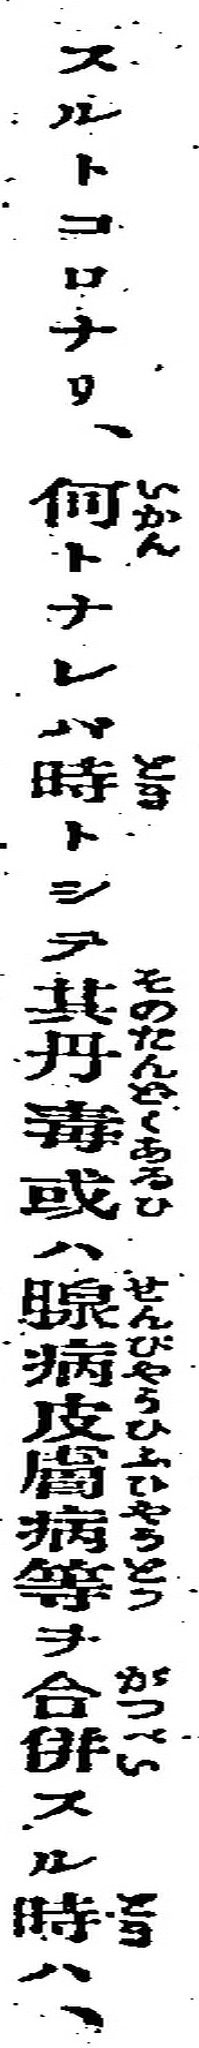スルトコロナリ、何トナレバ時トシテ其丹毒或ハ腺病皮膚病等ヲ合併スル時ハ、
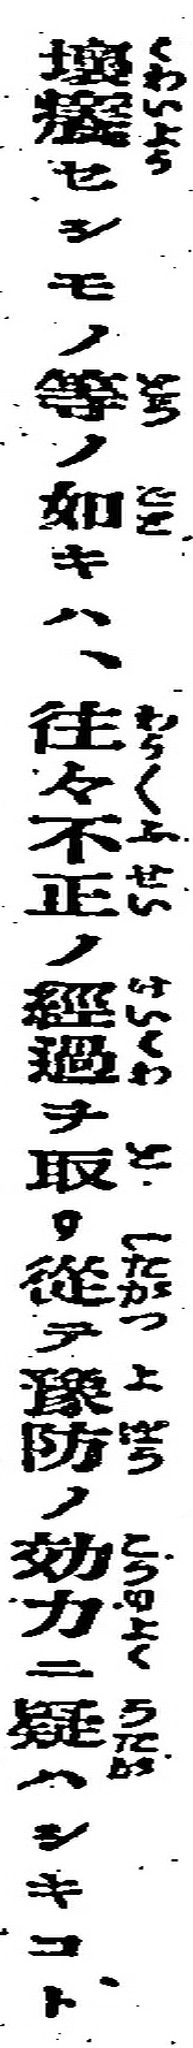壌癢セシモノ等ノ如キハ、往々不正ノ経過ヲ取リ縱テ予防ノ効力ニ疑ハシキコト
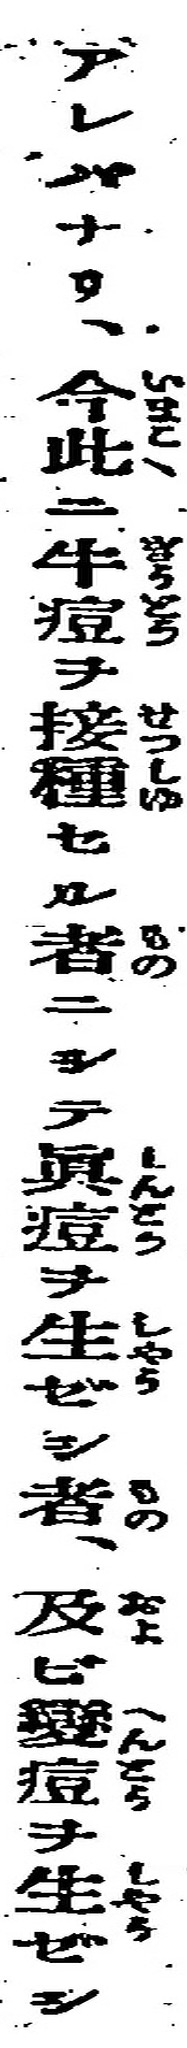アレバナリ、今此ニ牛痘ヲ接種セル者ニシテ真痘ヲ生ゼシ者、及ビ変痘ヲ生ゼシ
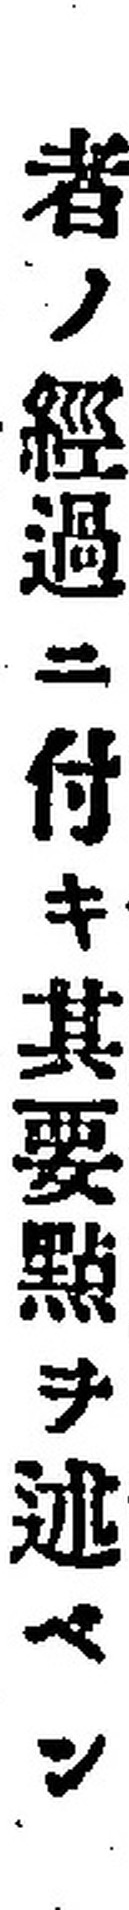者ノ経過ニ付キ其要点ヲ述ベン
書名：天然痘予防注意兼種痘者之注意
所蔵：国立国会図書館 National Diet Library, JAPAN
